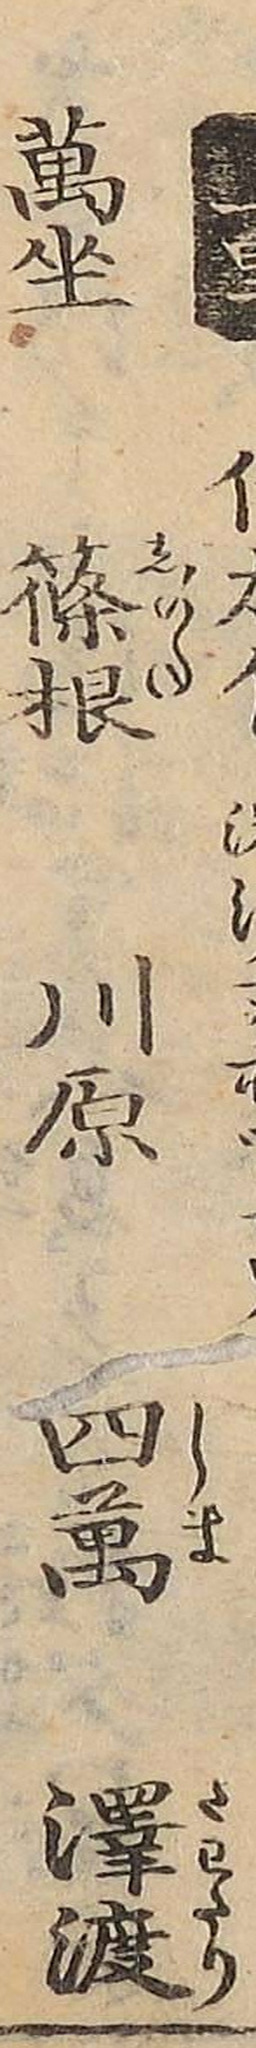万坐篠根川原四万沢渡
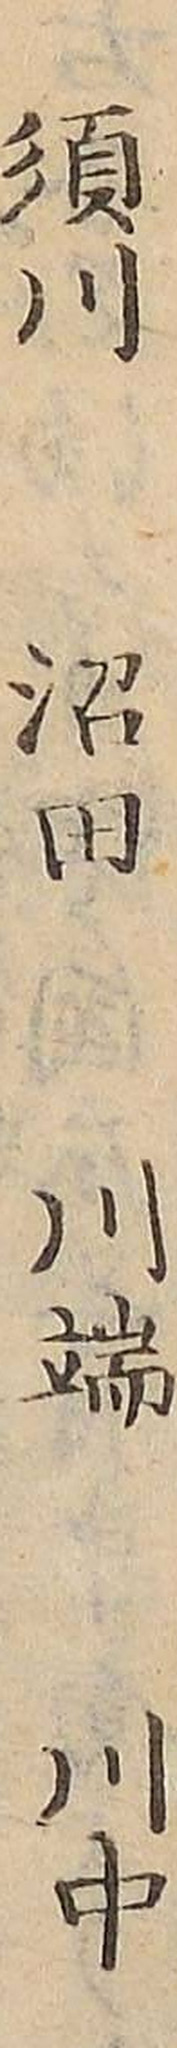須川沼田川端川中
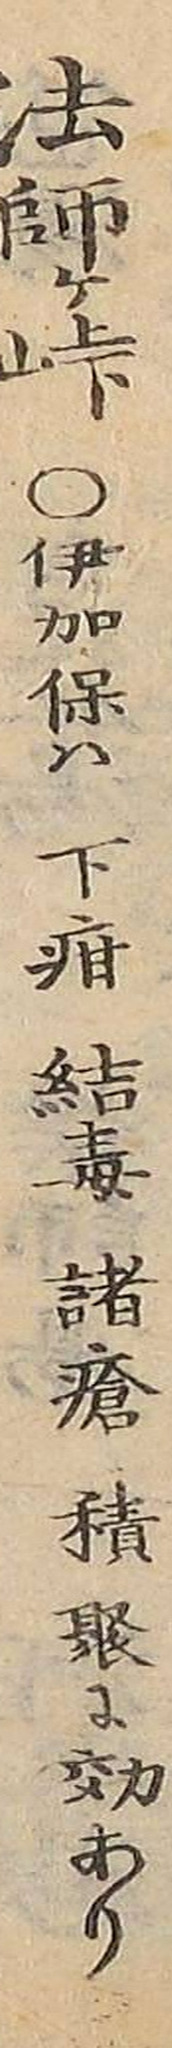法師ケ峠○伊加保は下疳結毒諸瘡積聚に効あり
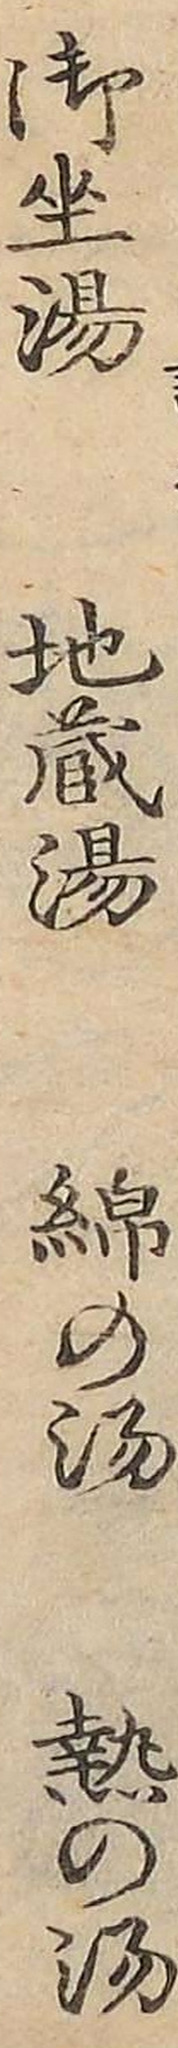御坐湯地蔵湯綿の湯熱の湯
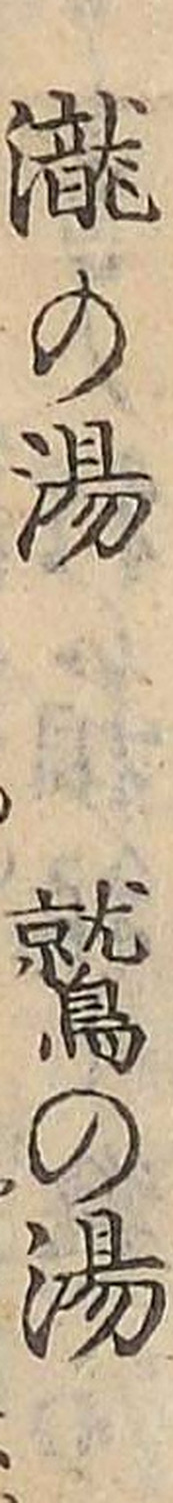滝の湯鷲の湯
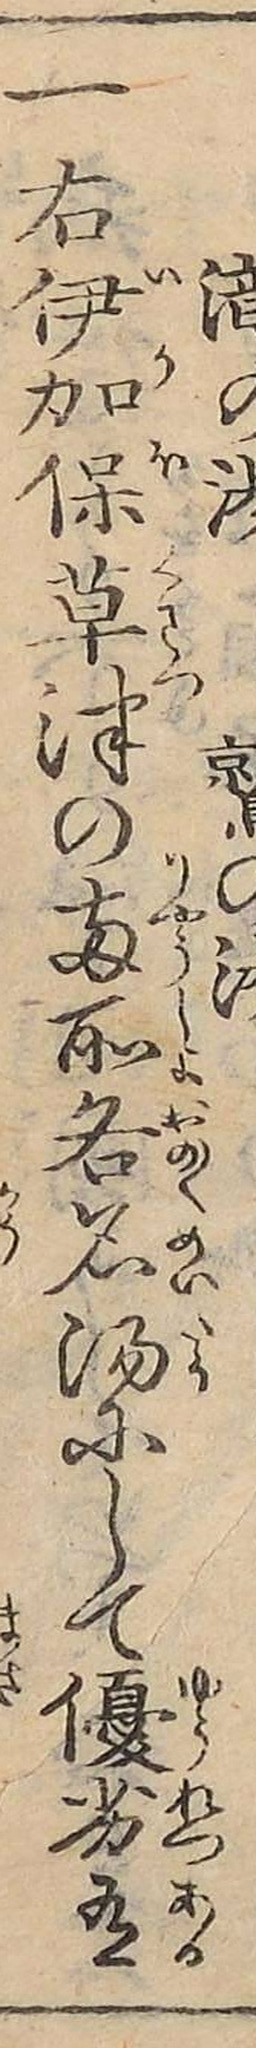一右伊加保草津の両所各名湯にして優劣有
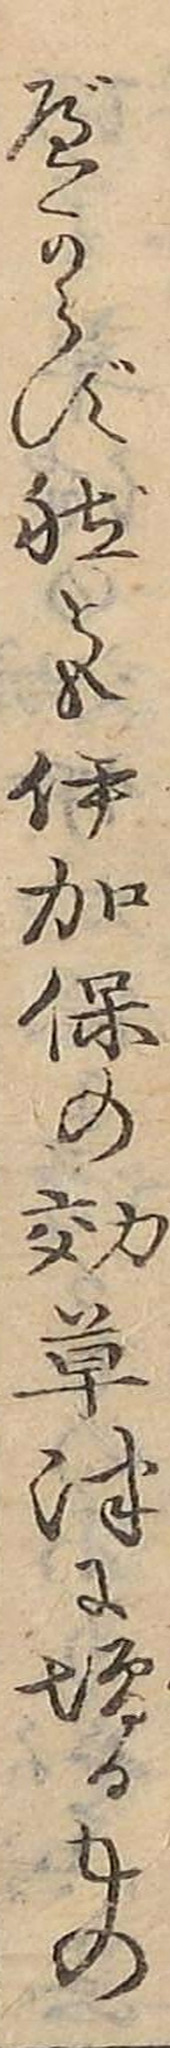べからず然とも伊加保の効草津に増るもの

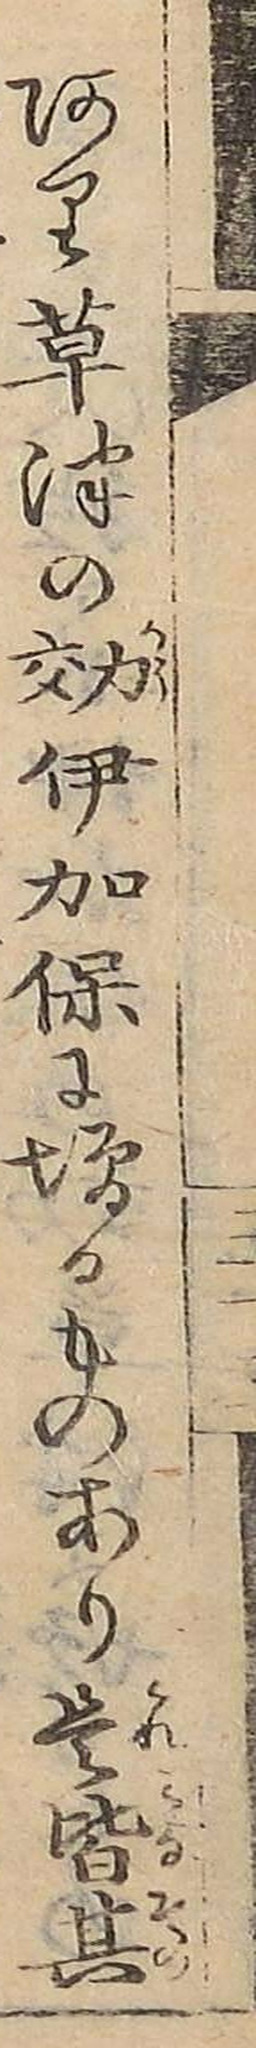あり草津の効伊加保に増るものあり是皆其
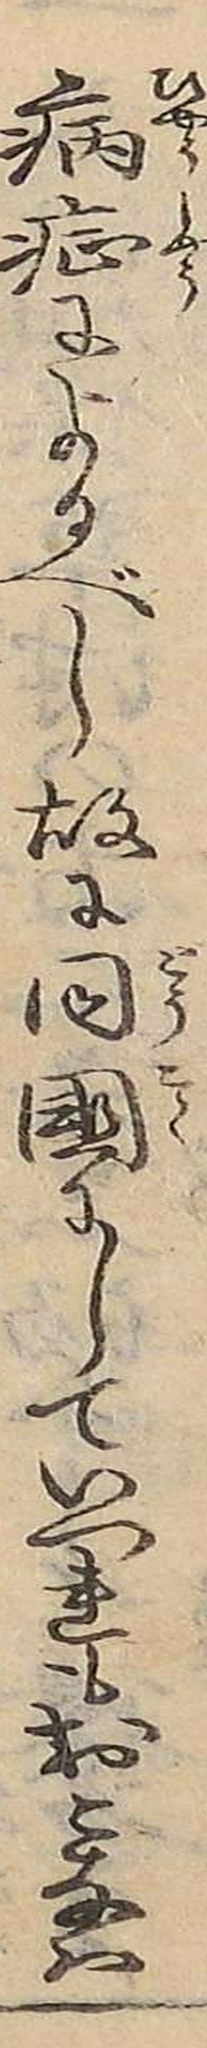病症によるべし故に同国にしていつれもおこなは
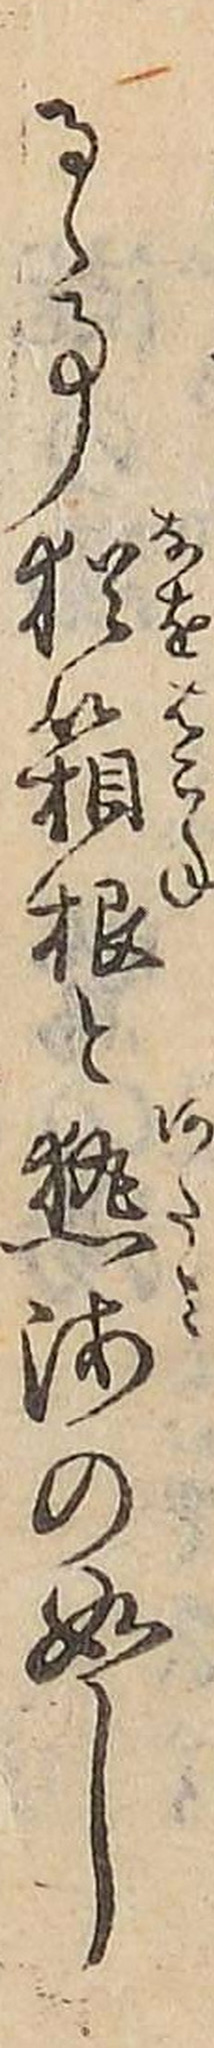るゝ事猶箱根と熱海の如し
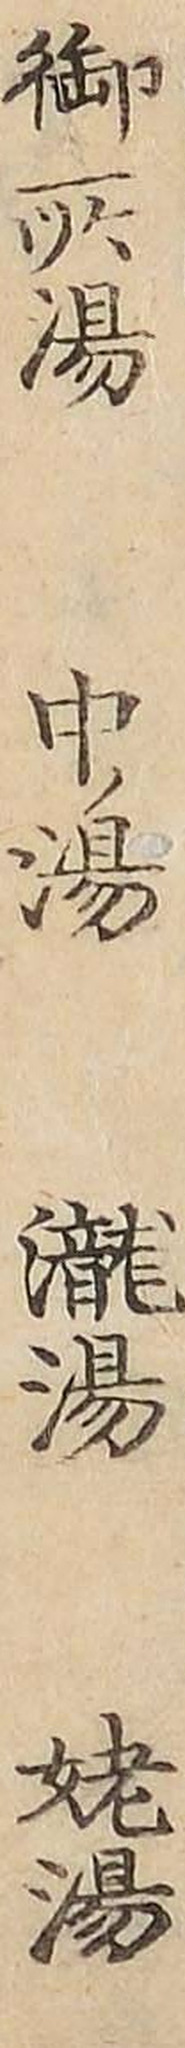御所湯中ノ湯滝湯姥湯
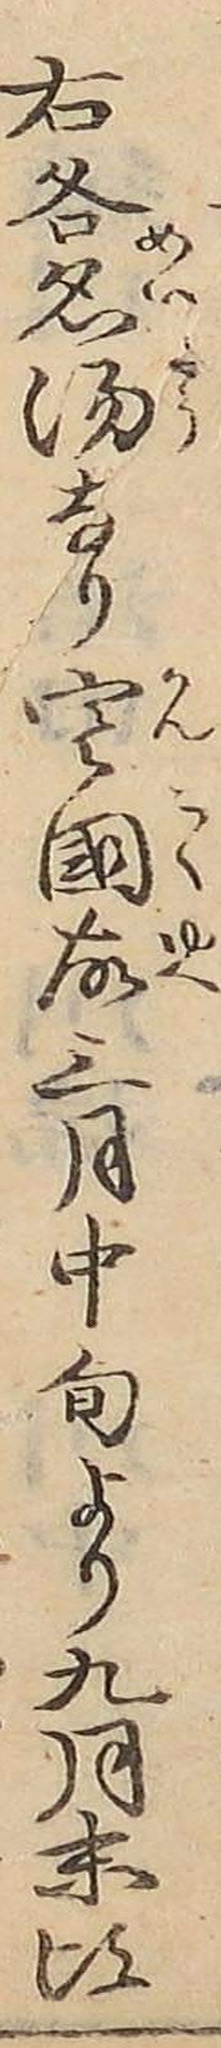右各名湯なり寒国故三月中旬より九月末頃
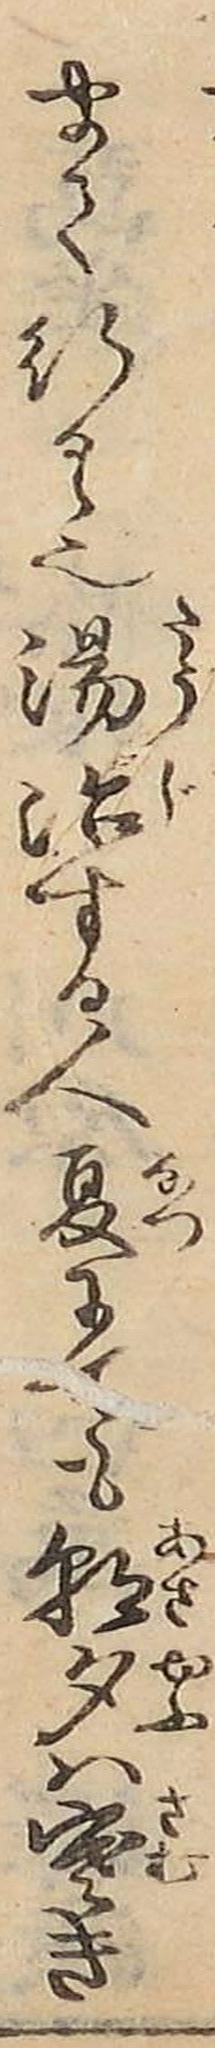まて行るゝ也湯治する人夏にても朝夕は寒き
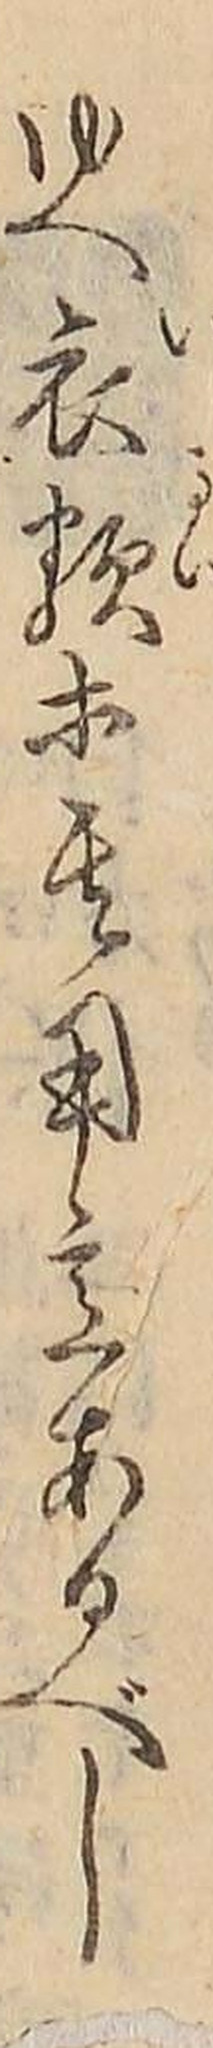ゆへ衣類等其用意あるべし
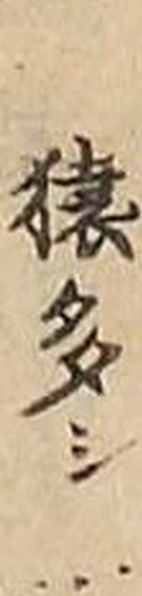猿多シ
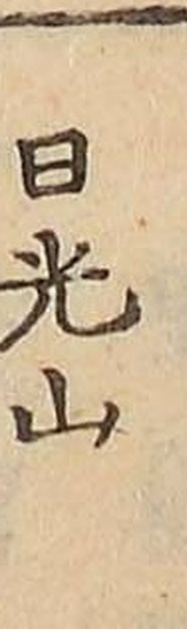日光山
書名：旅行用心集
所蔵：神戸大学附属図書館 国文学研究資料館
